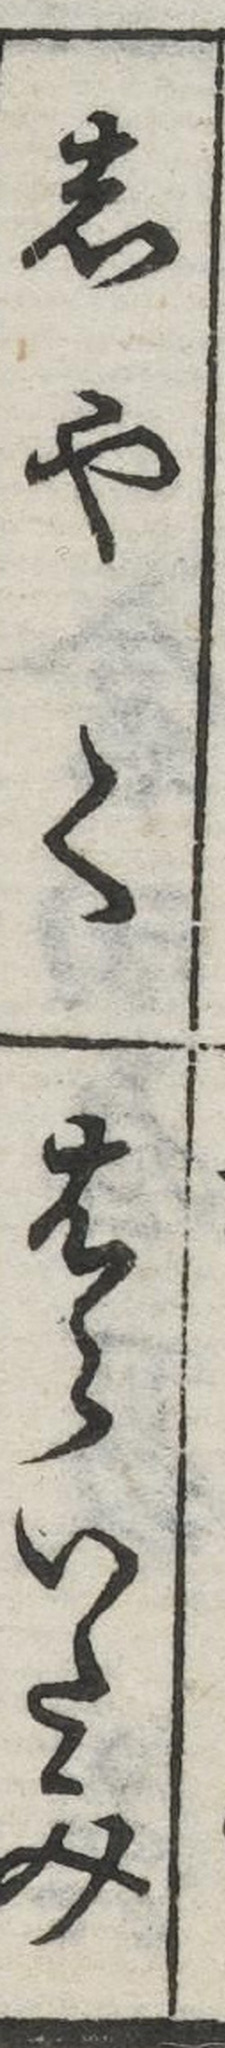しやくはらいたみ
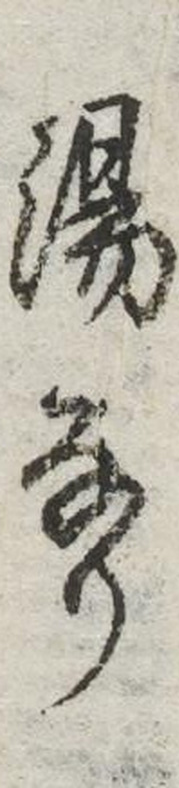湯なり
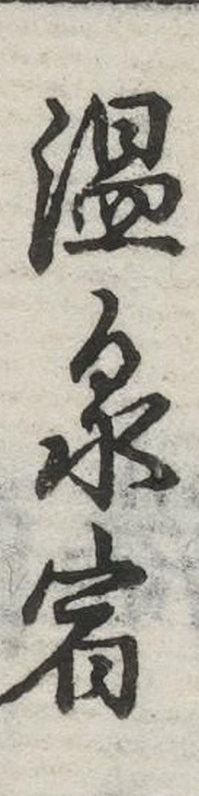温泉宿
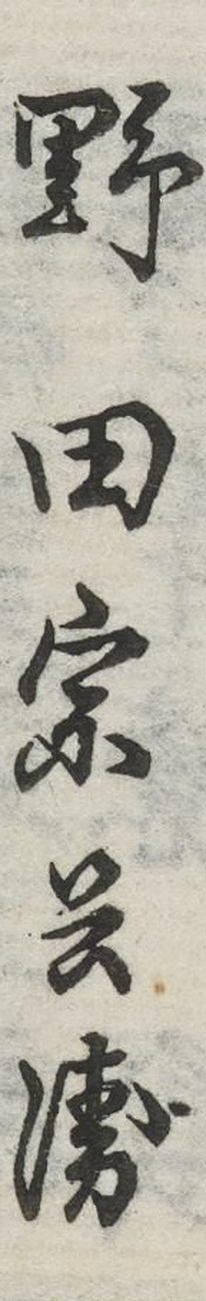野田宗兵衛
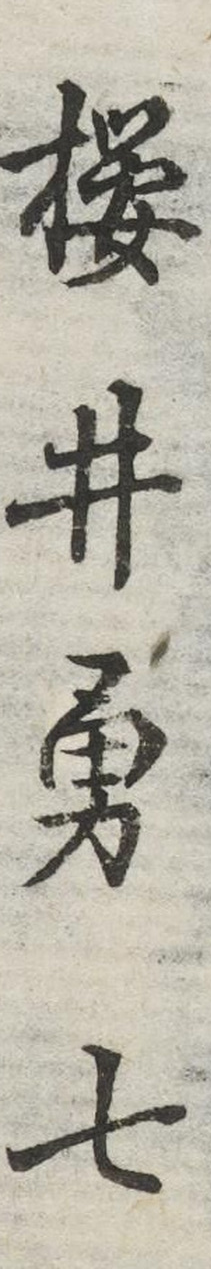桜井勇七
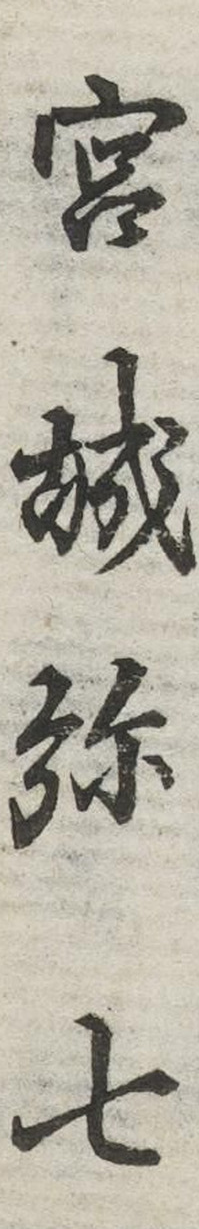宮城弥七

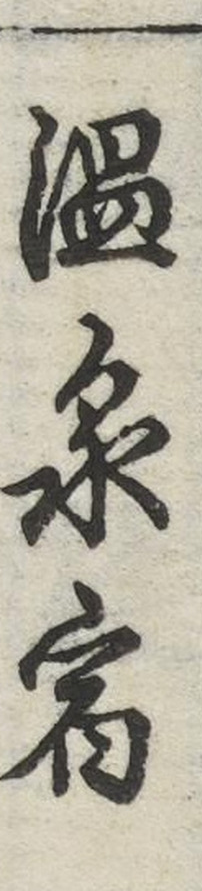温泉宿
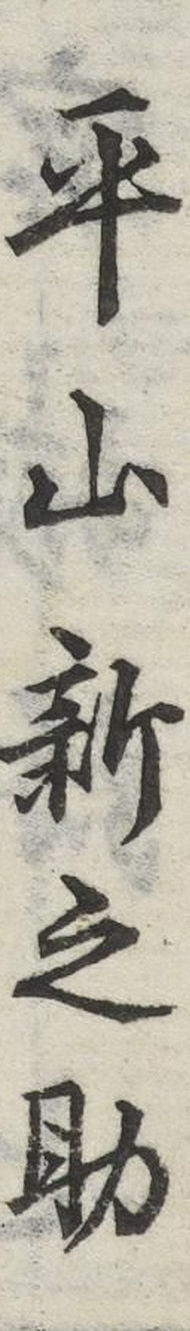平山新之助
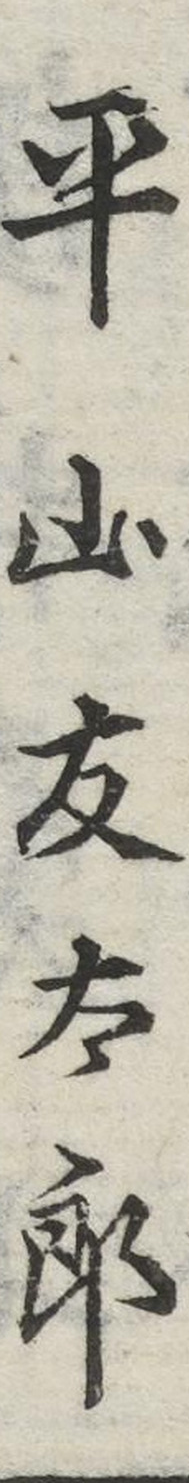平山友太郎
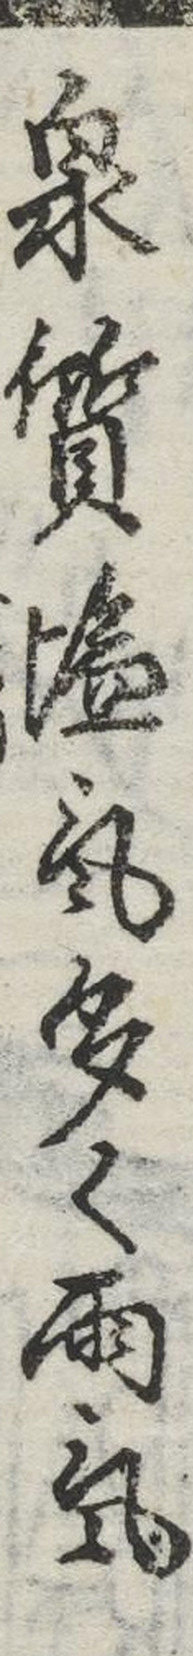泉質塩気多く雨気
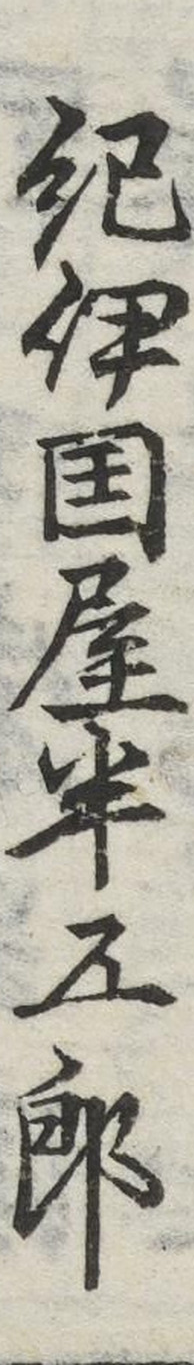紀伊国屋半五郎
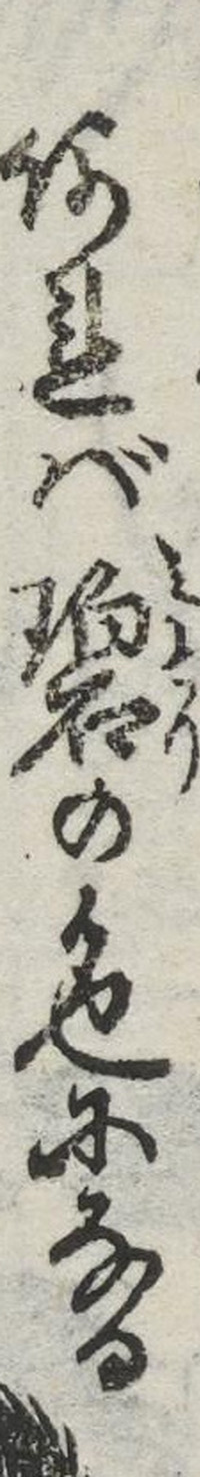あれば碧の色になる
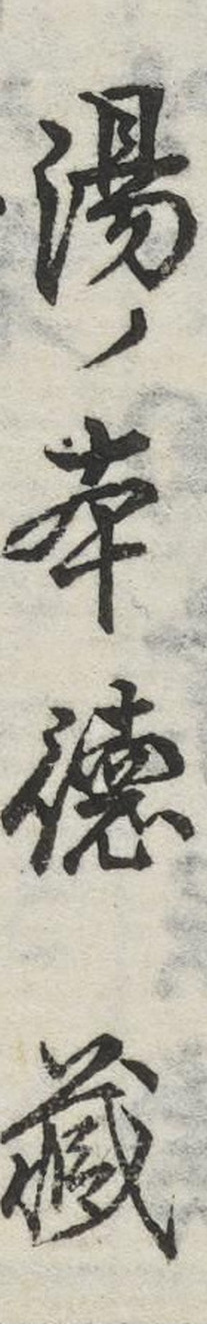湯ノ本徳蔵
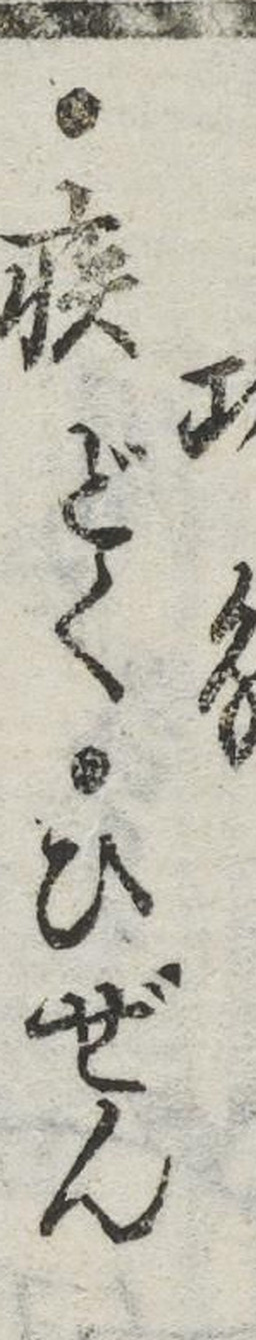●疾どく●ひぜん
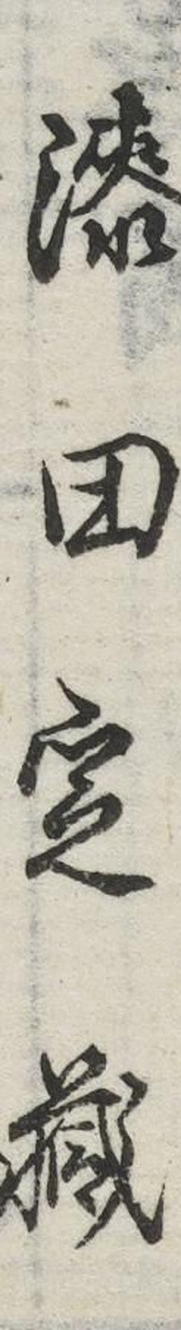漆田定蔵
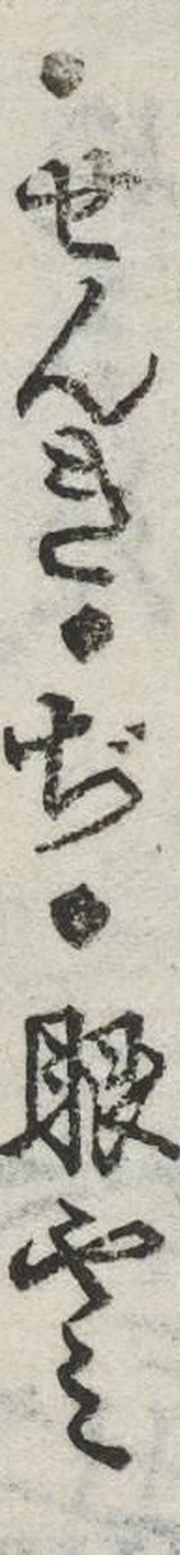●せんき●ぢ●眼やみ
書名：諸國温泉遊覽記　全
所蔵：東京大学地震研究所図書室 Earthquake Research Institute Library, The University of Tokyo, JAPAN
